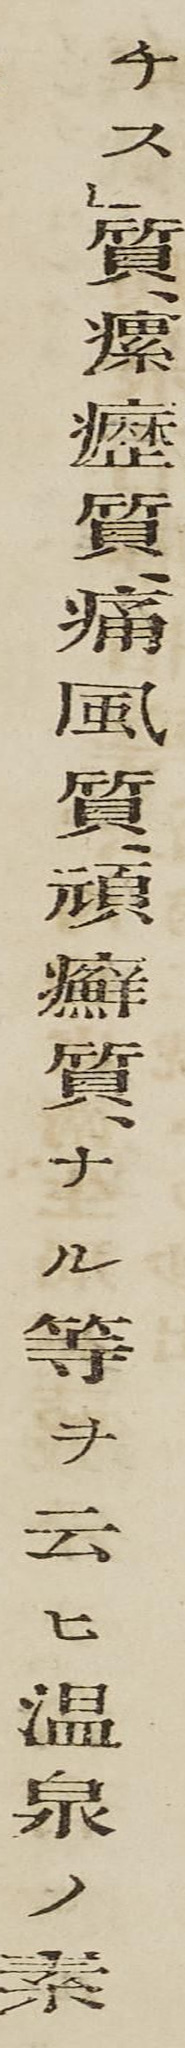チス」質、瘰癧質、痛風質、頑癬質、ナル等ヲ云ヒ温泉ノ素
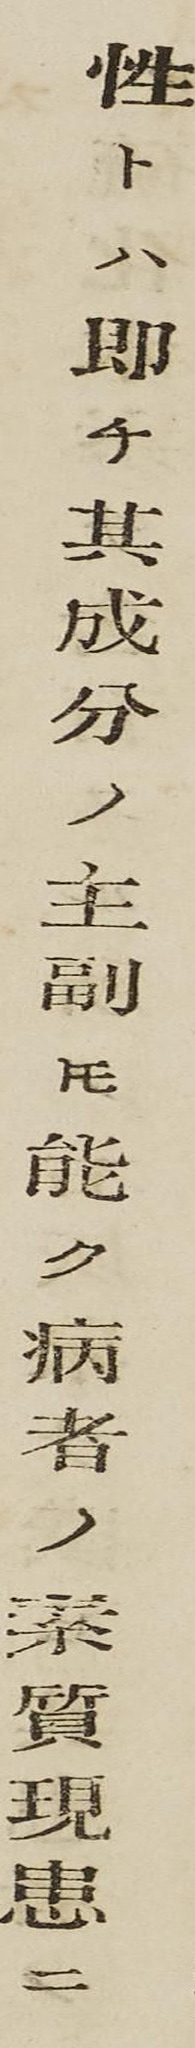性トハ即チ其成分ノ主副トモ能ク病者ノ素質現患ニ
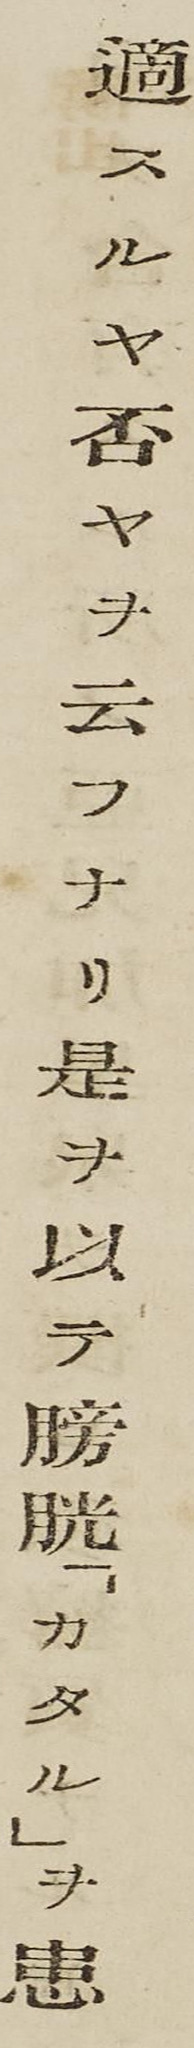適スルヤ否ヤヲ云フナリ是ヲ以テ膀胱「カルタ」ヲ患
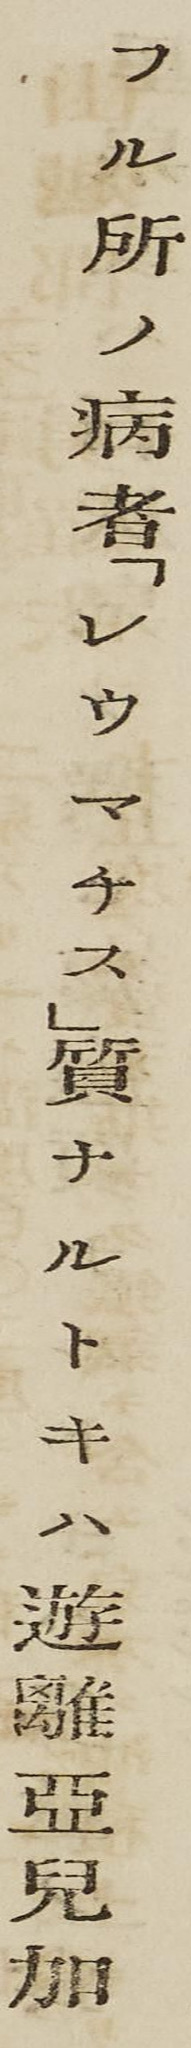フル所ノ病者「レウマチス」質ナルトキハ遊離亜児加

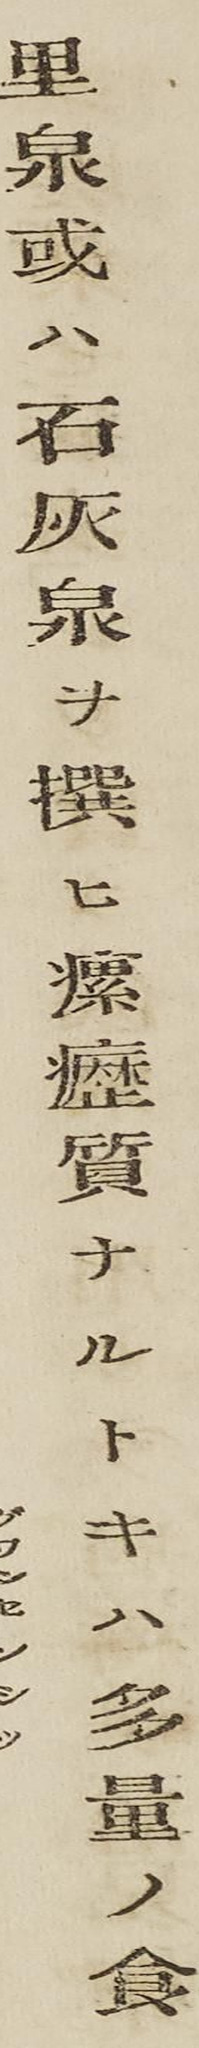里泉或ハ石灰泉ヲ撰ヒ瘰癧質ナルトキハ多量ノ食
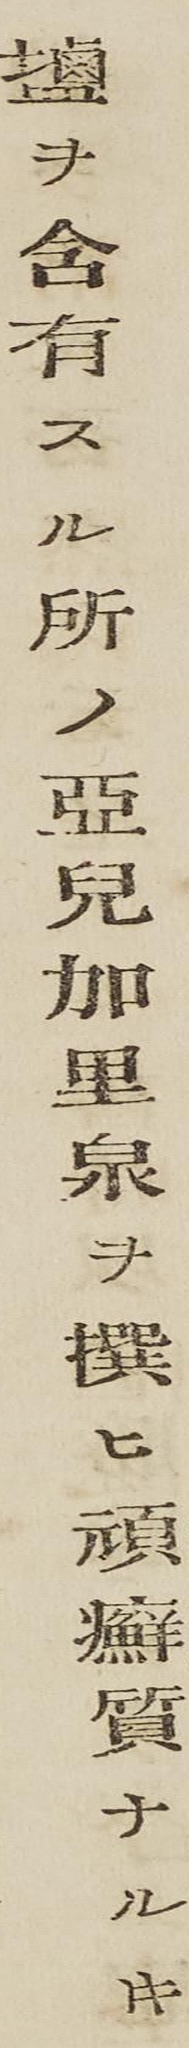塩ヲ含有スル所ノ亜而加里泉ヲ撰ヒ頑癬質ナルトキ
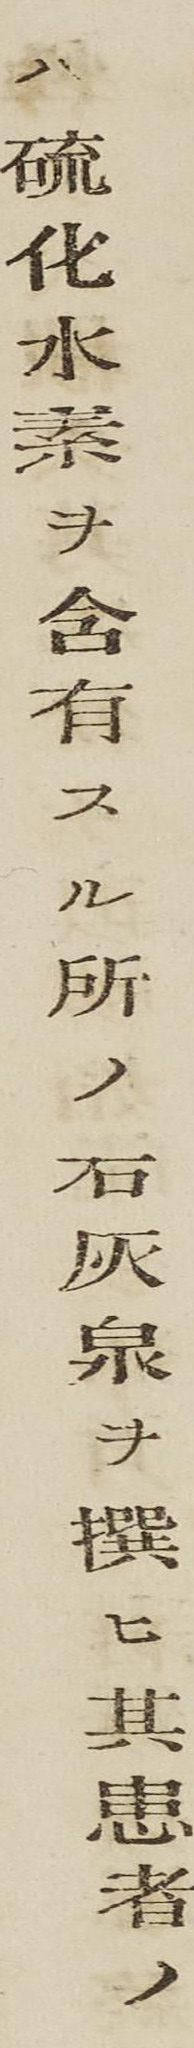ハ硫化水素ヲ含有スル所ノ石灰泉ヲ撰ヒ其患者ノ
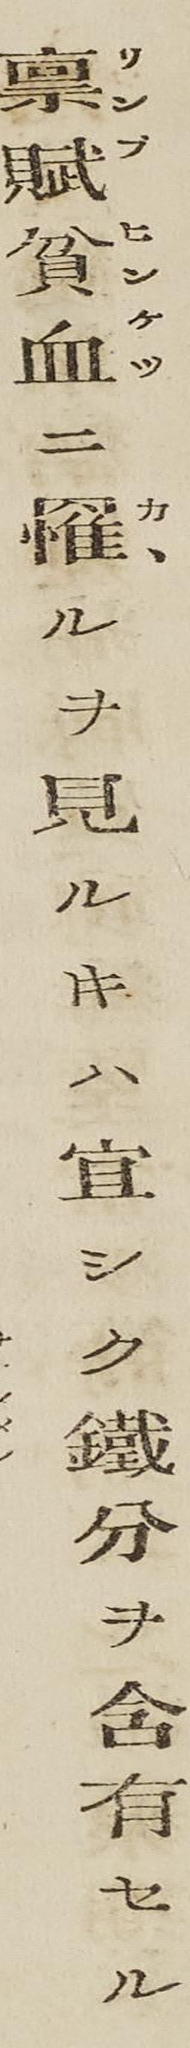稟賦貧血ニ罹ルヲ見ルトキハ宣シク鉄分ヲ含有セル
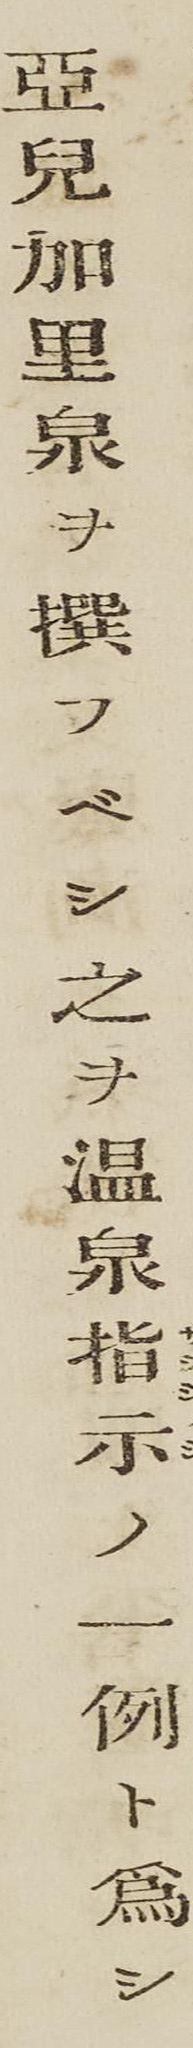亜而加里泉ヲ撰フベシ之ヲ温泉指示ノ一例ト為シ
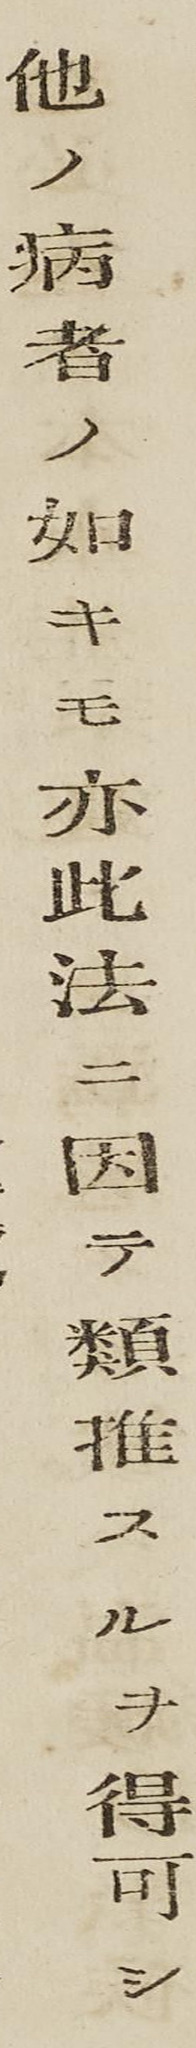他ノ病者ノ如キモ亦此法ニ因テ類推スルヲ得可シ
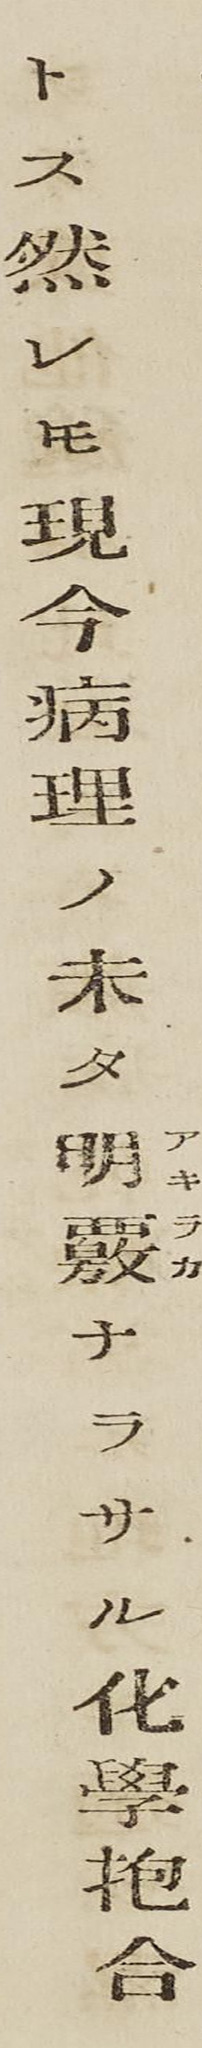トス然レトモ現今病理ノ未タ明覈ナラサル化学抱合
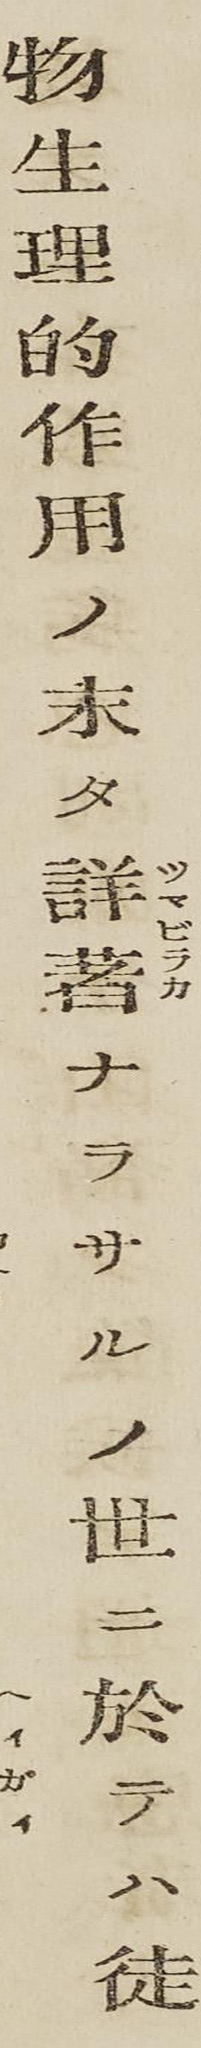物生理的作用ノ末タ詳著ナラサルノ世ニ於テハ徒
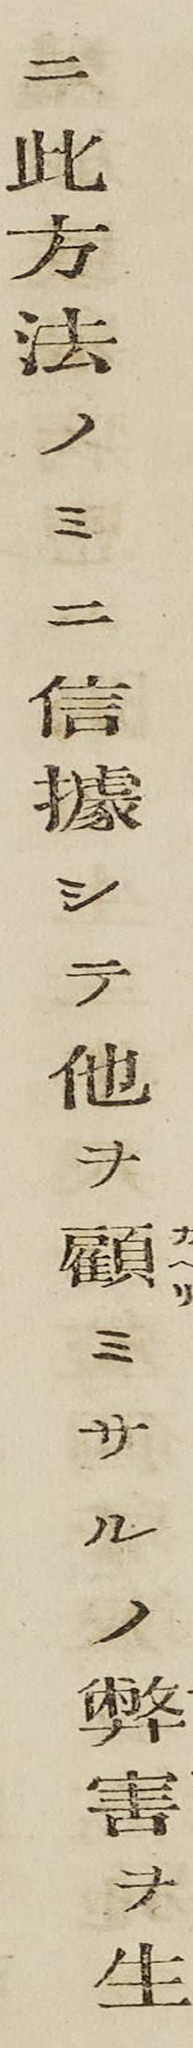ニ此方法ノミニ信拠シテ他ヲ顧ミサルノ弊害ヲ生
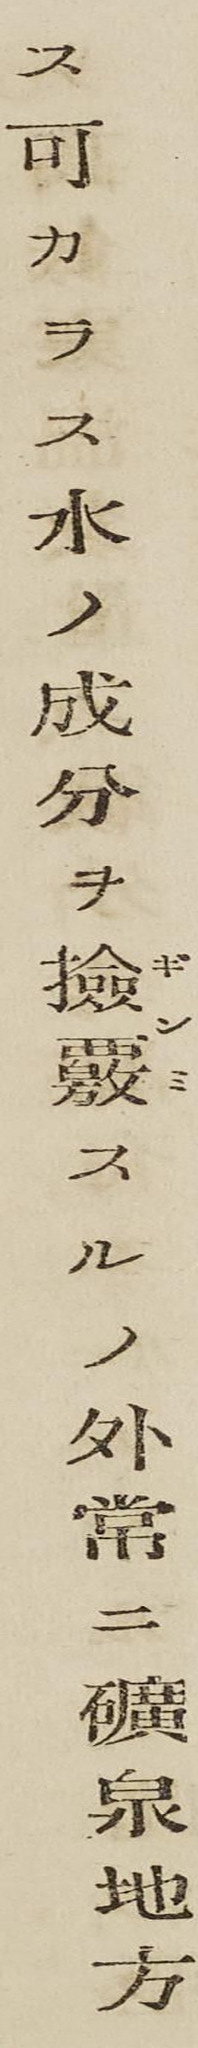ス可カラス水ノ成分ヲ検覈スルノ外常ニ礦泉地方
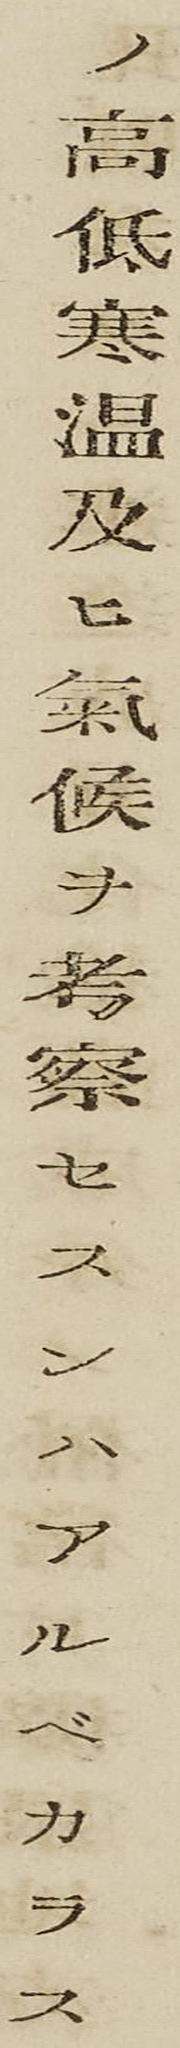ノ高低寒温及ヒ気候ヲ考察セスンハアルベカラス
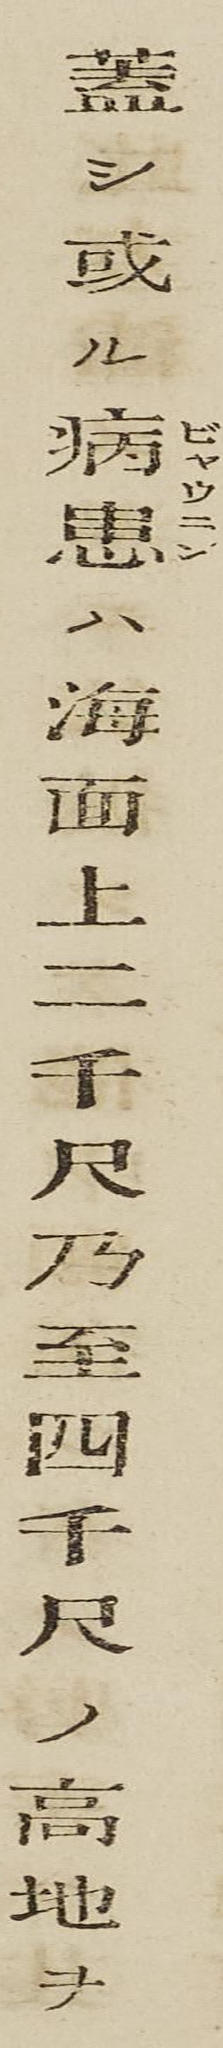蓋シ或ル病患八海面上二千尺乃至四千尺ノ高地ヲ
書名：日本温泉考
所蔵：東京大学地震研究所図書室 Earthquake Research Institute Library, The University of Tokyo, JAPAN
